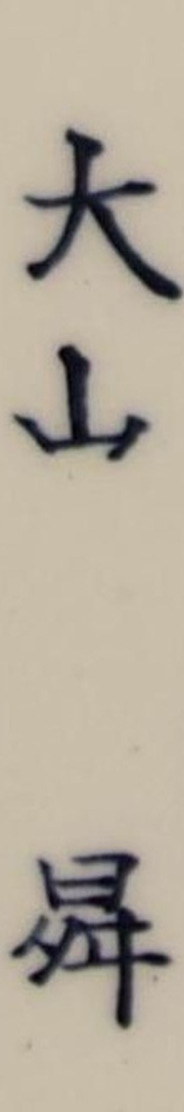大山昇
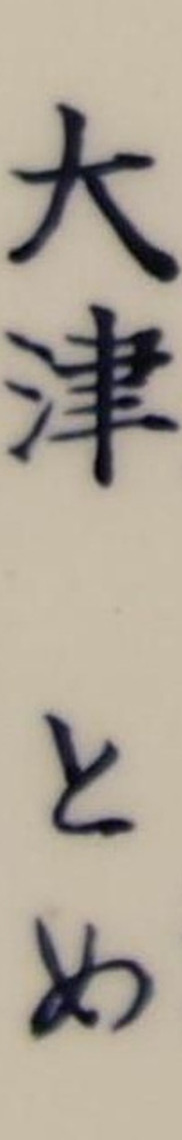大津とめ
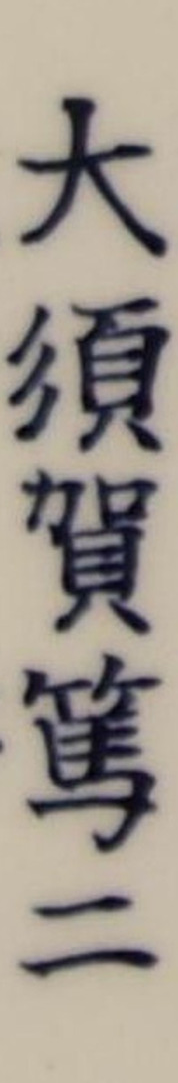大須賀篤二
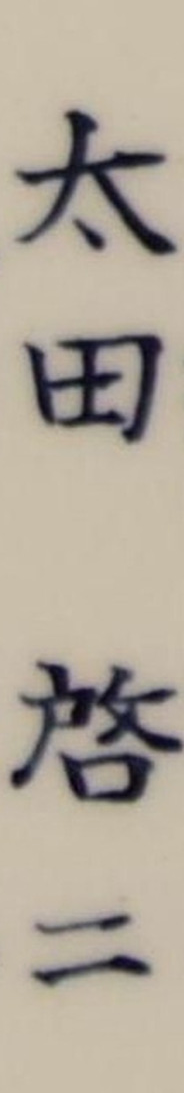太田啓二
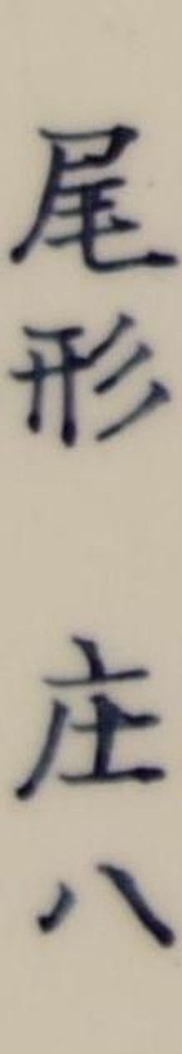尾形庄八
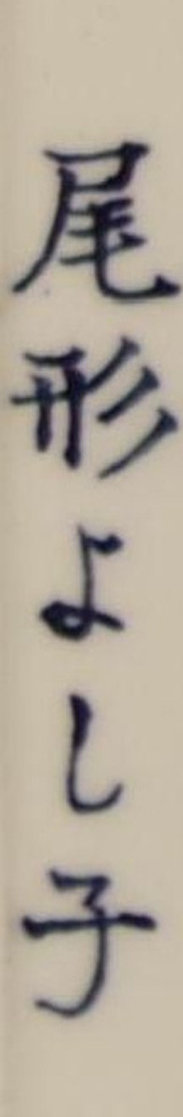尾形よし子

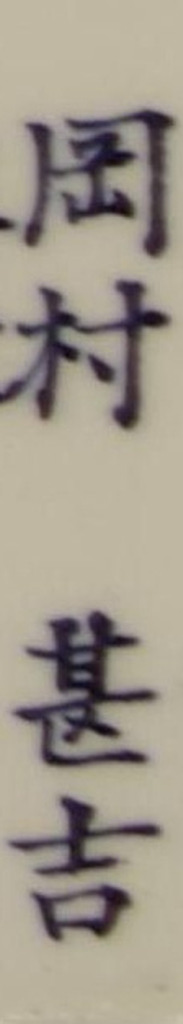岡村甚吉
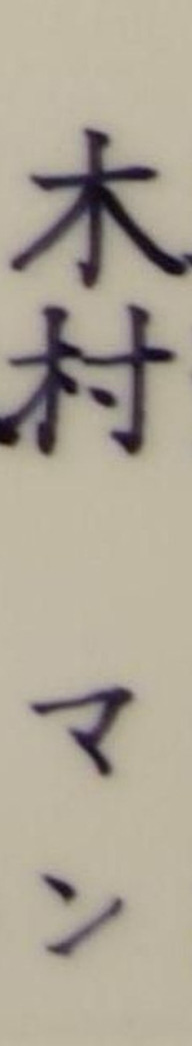木村マン
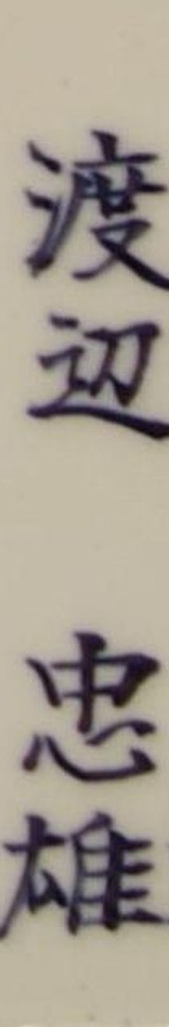渡辺忠雄
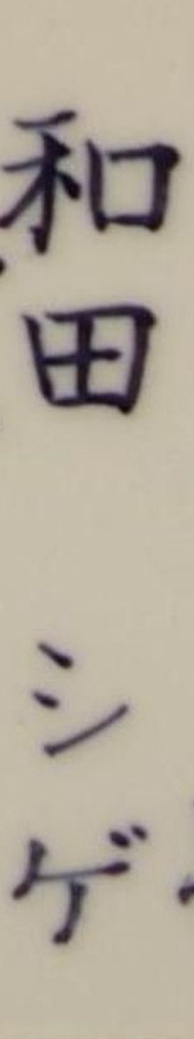和田シゲ
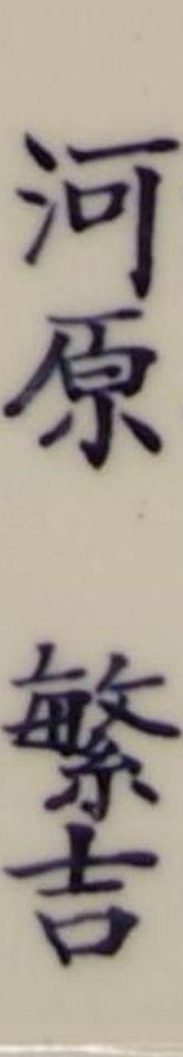河原繁吉
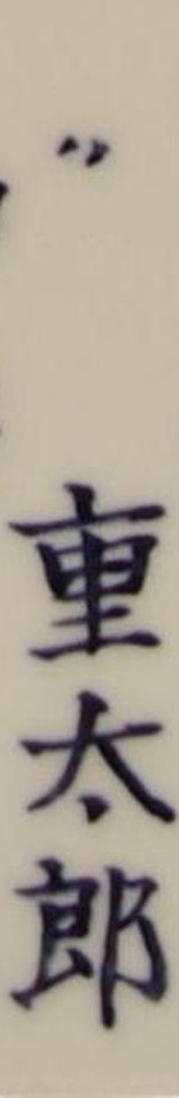重太郎
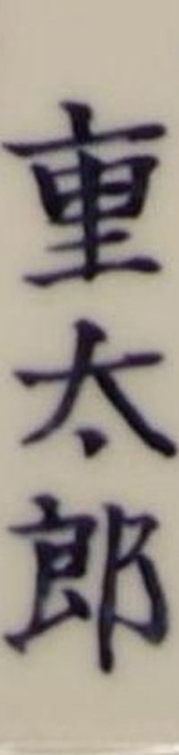重太郎
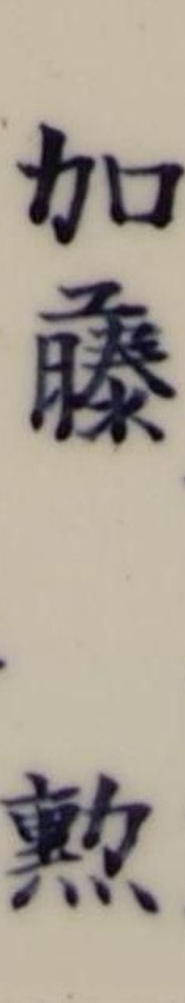加藤勲
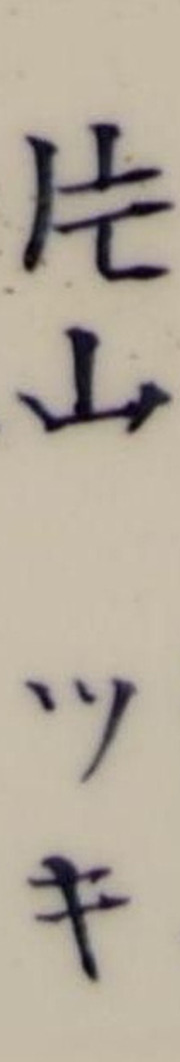片山ツキ
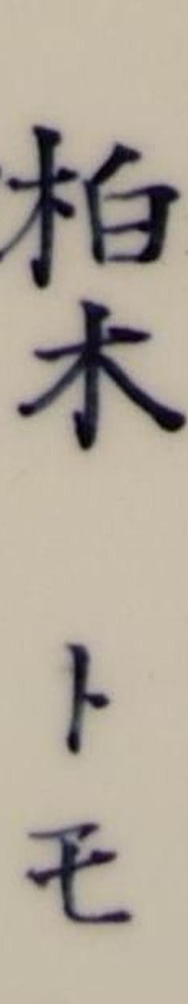柏木トモ
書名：M~S
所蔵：高野山金剛峯寺
